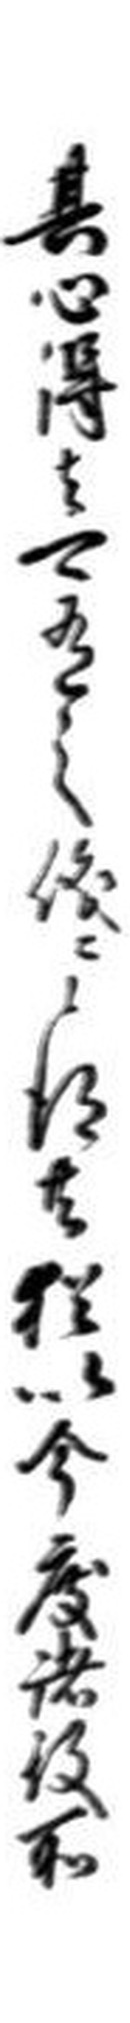其心得者可有之儀ニ候得共猶以今度諸役所
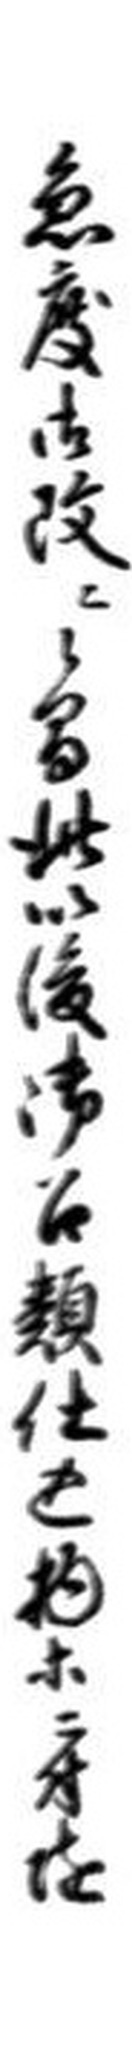急度御改ニ候間此以後御召類仕込物等ニ付随
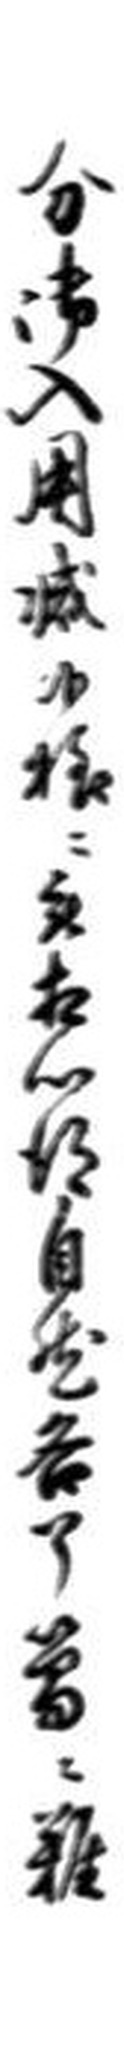分御入用減候様ニ被相心得自然各了簡ニ難
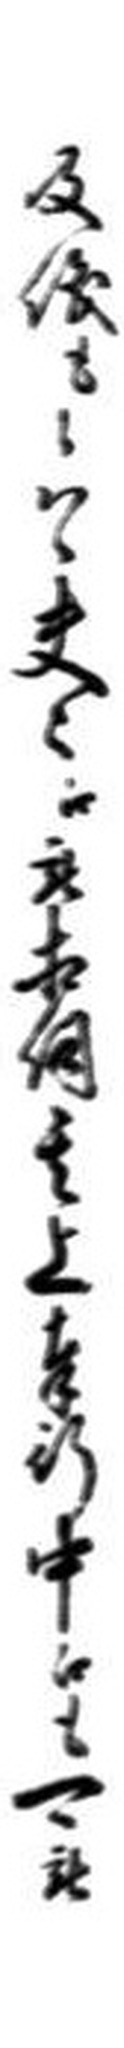及儀も候ハヽ夫々江被相伺其上奉行中江も可被
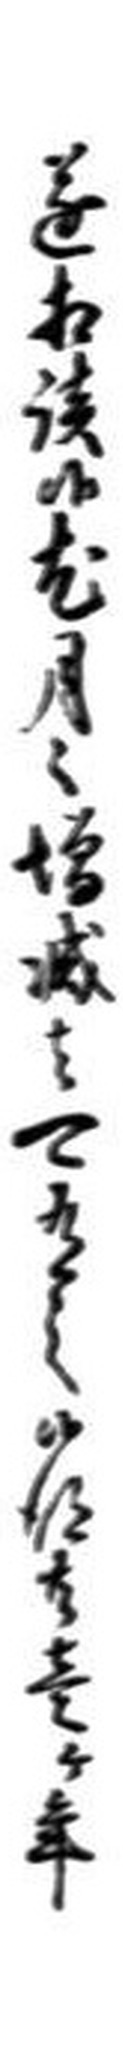遂相談候尤月々増減者可有之候得共壱ヶ年
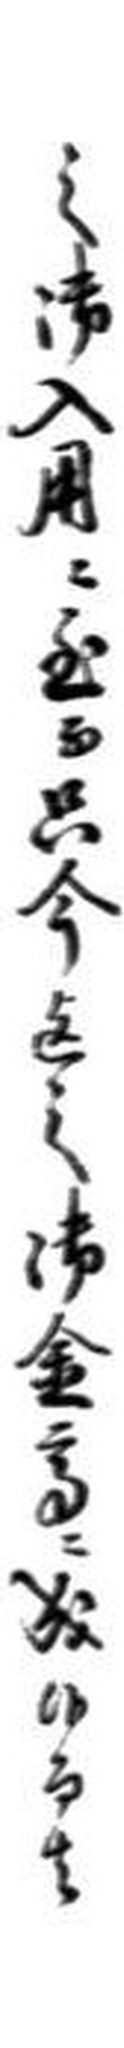之御入用ニ至而只今迄之御金高ニ成候而者
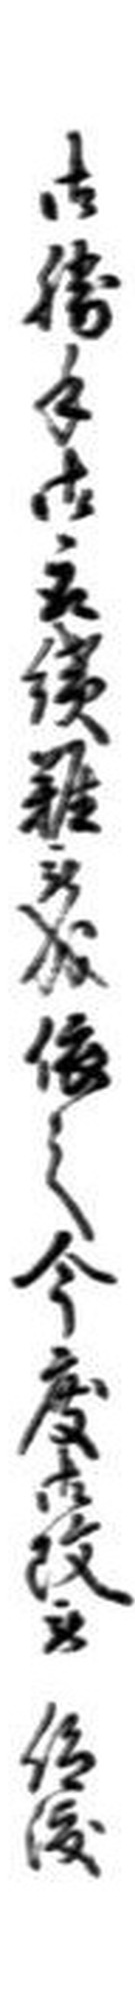御勝手御取続難被成依之今度御改被仰渡
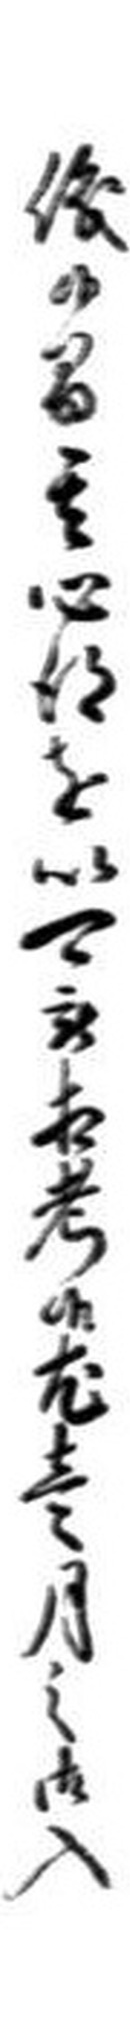儀候間其心得を以被相考候尤壱月之御入
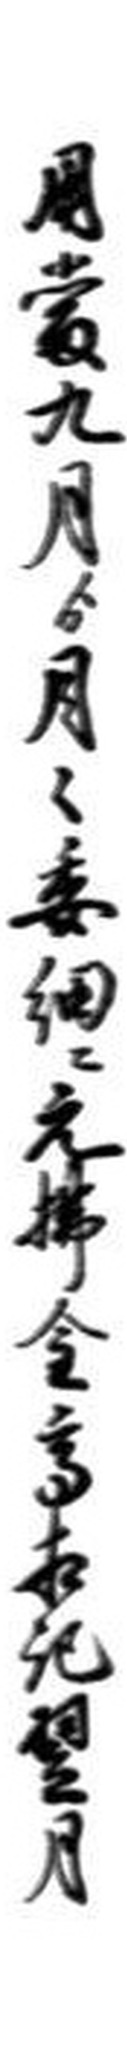用当九月ゟ月々委細ニ元払金高相記翌月

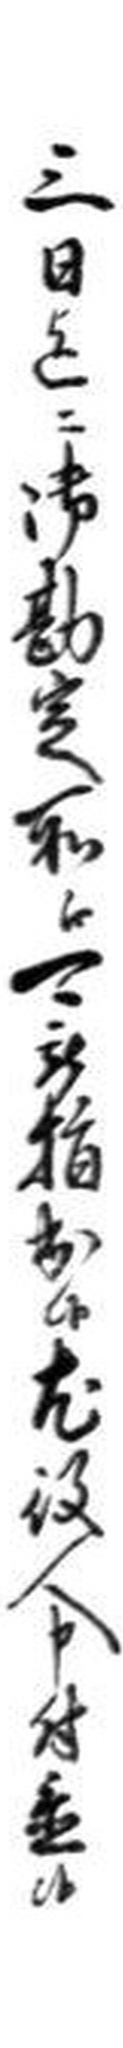三日迄ニ御勘定所江可被指出候尤役人申付置候
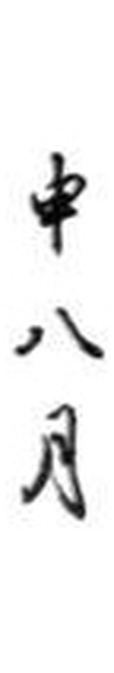申八月
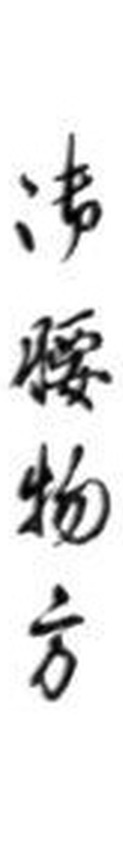御腰物方
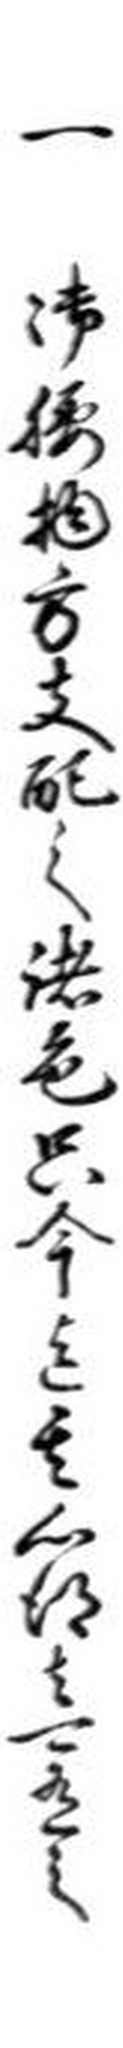一御腰物方支配之諸色只今迄其心得者可有之
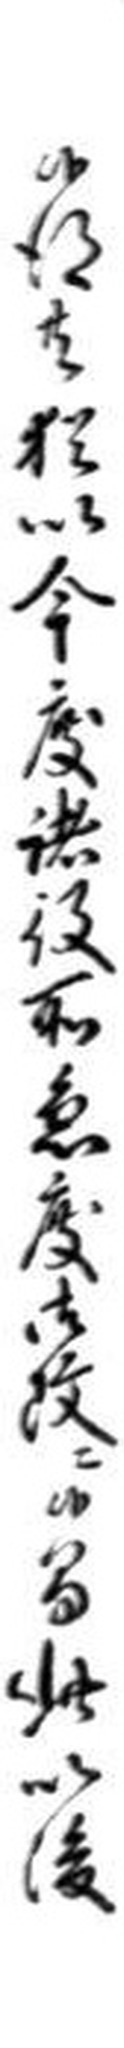候得共猶以今度諸役所急度御改ニ候間此以後
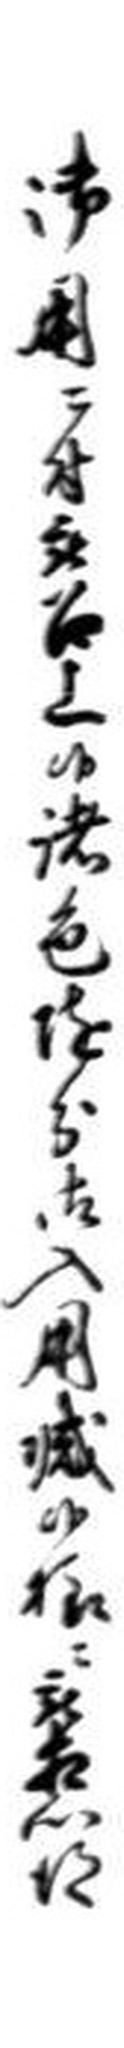御用ニ付被召上候諸色随分御入用減候様ニ被相心得
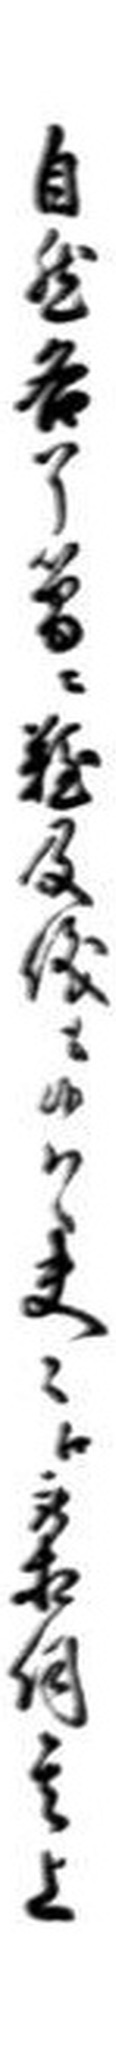自然各了簡ニ難及儀も候ハヽ夫々江被相伺其上
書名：家譜 三十一 吉邦公 享保元年
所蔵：福井県文書館 Fukui Prefectural Archives
